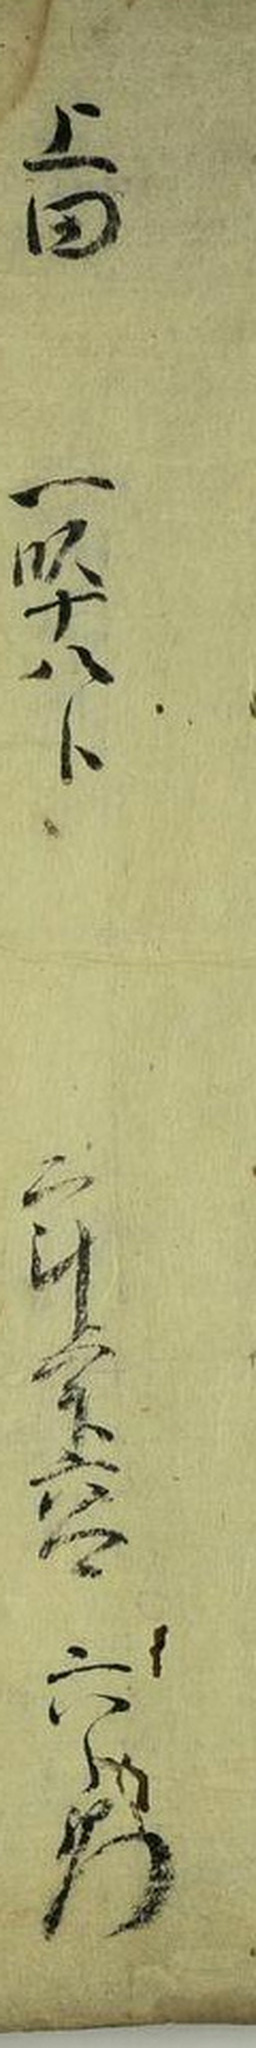上田一畝十八歩二斗五升六合六郎右衛門
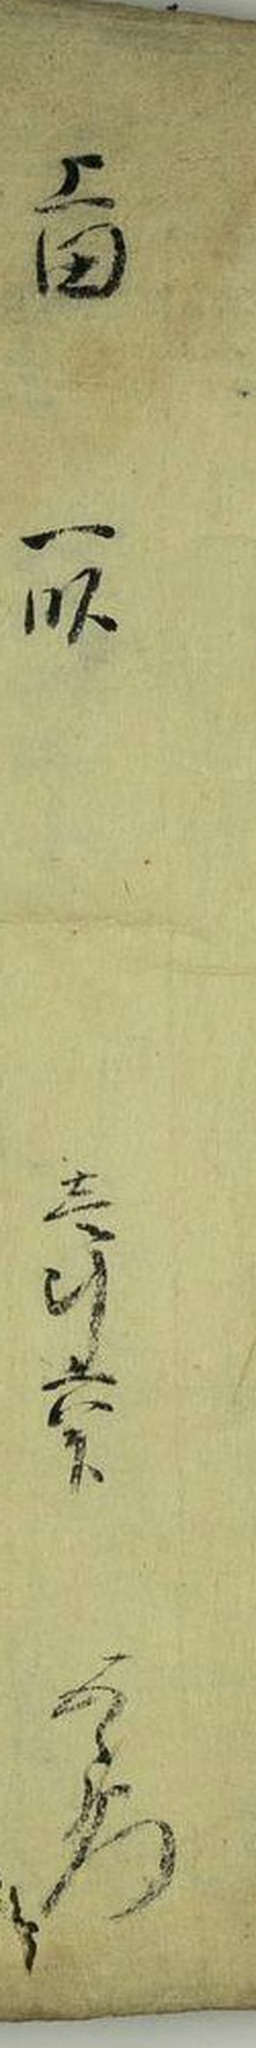上田一畝壱斗六升五郎右衛門
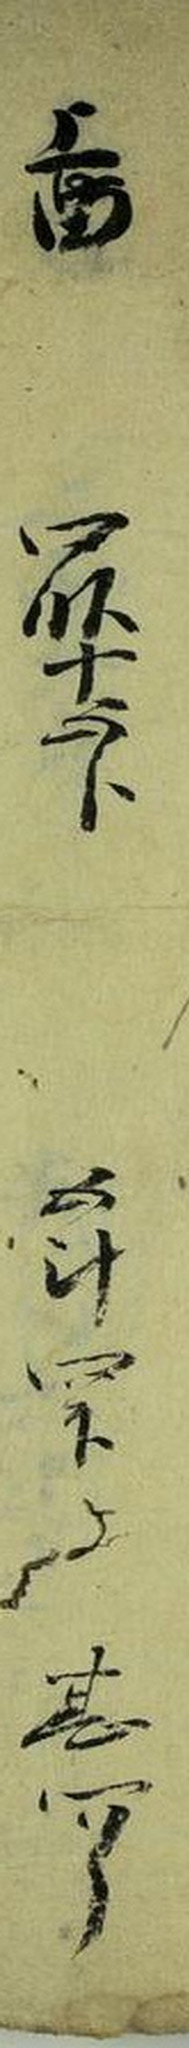上畠四畝十五歩五斗四升甚四郎
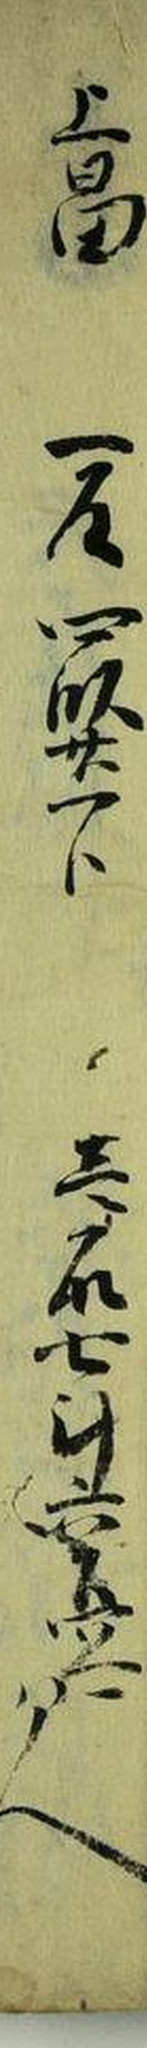上畠一反四畝廿一歩壱石七斗六升四合同人
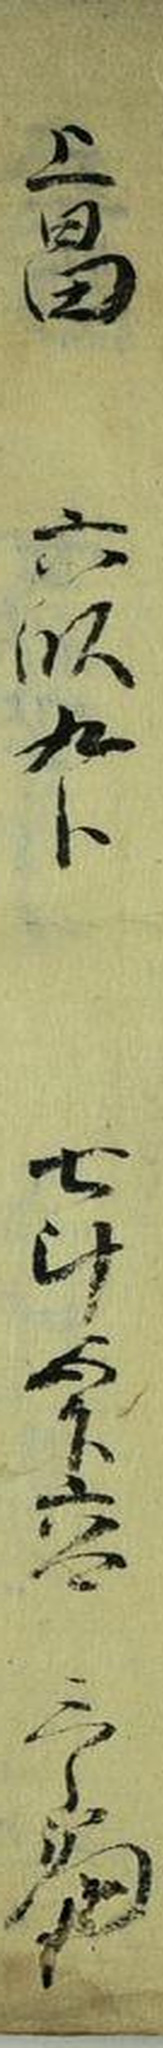上畠六畝九歩七斗五升六合六郎右衛門
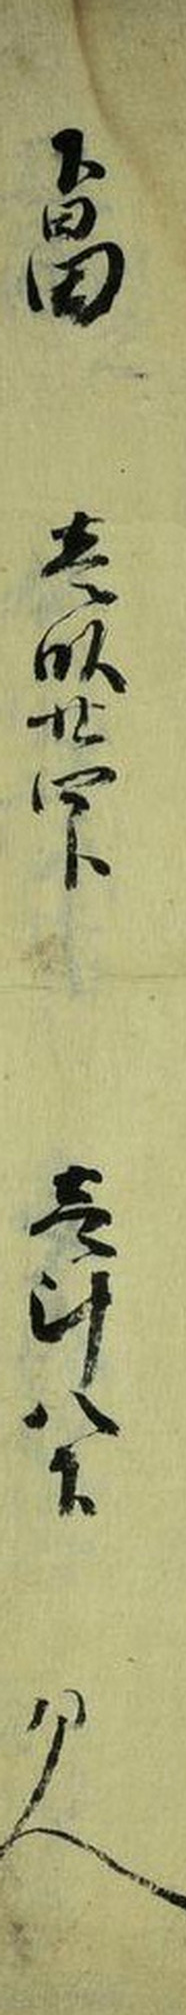下畠壱畝廿四歩壱斗八升同人
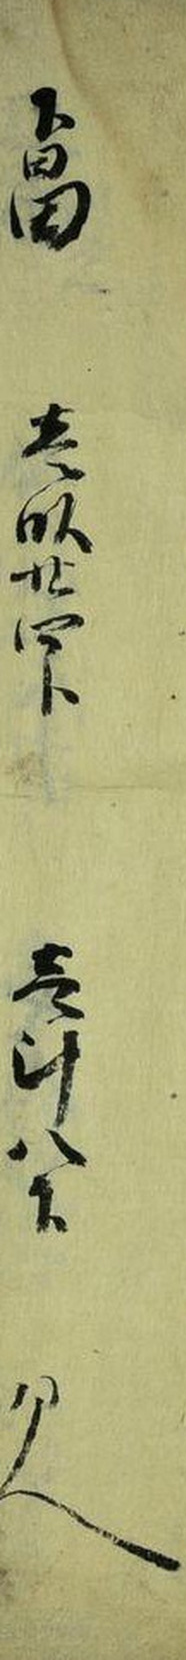下畠壱畝廿四歩壱斗八升同人
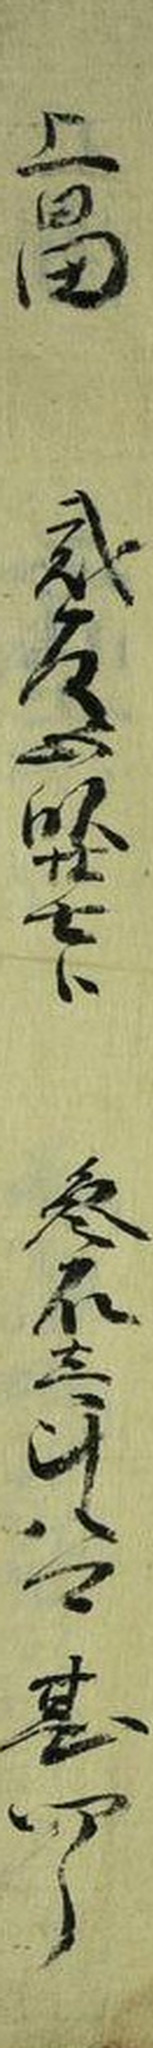上畠弐反五畝廿七歩参石一斗八合甚四郎

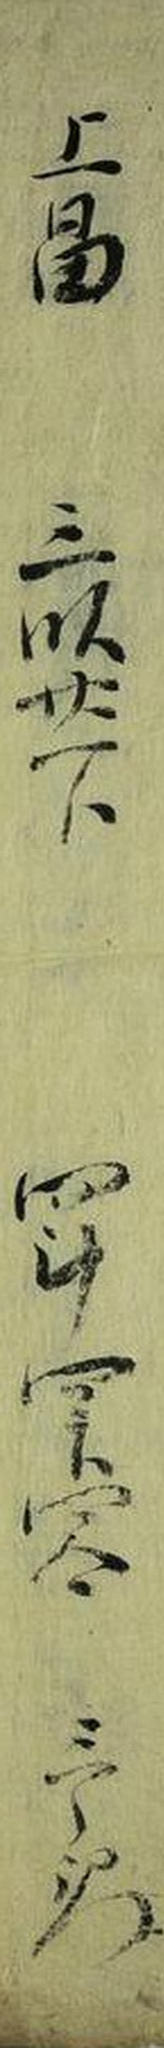上畠三畝廿一歩四斗四升四合三郎右衛門
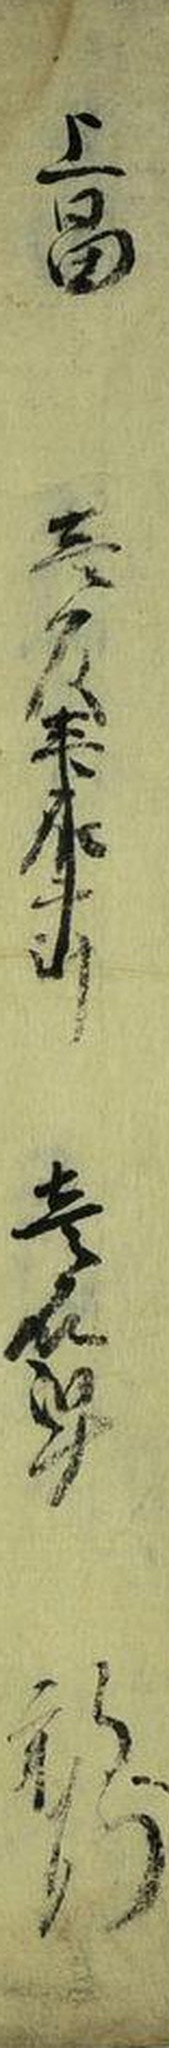上畠壱反三二斗壱石弐斗新右衛門
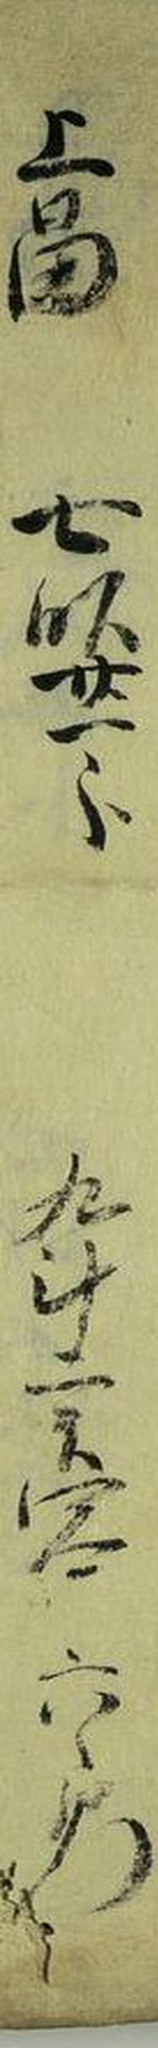上畠七畝廿一歩九斗二升四合六郎右衛門
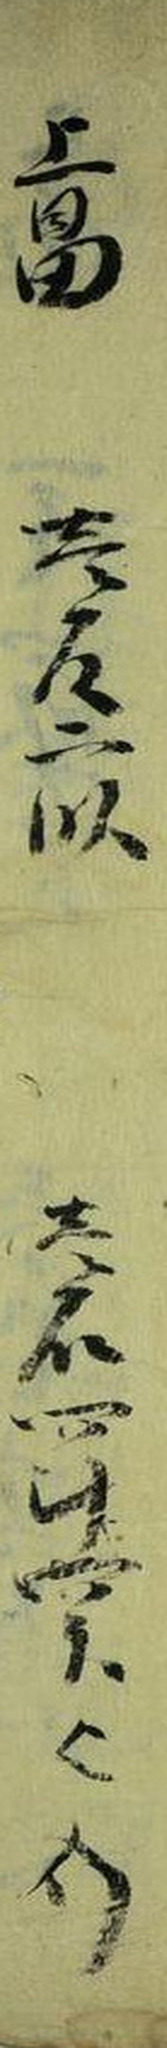上畠壱反二畝壱石四斗四合とみ
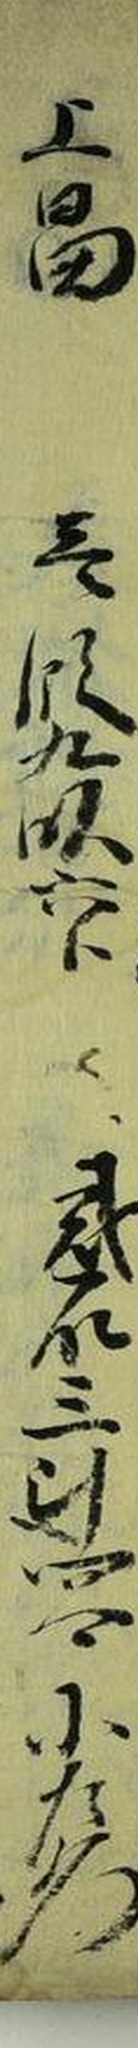上畠壱段九畝六歩弐石三斗四合小左衛門
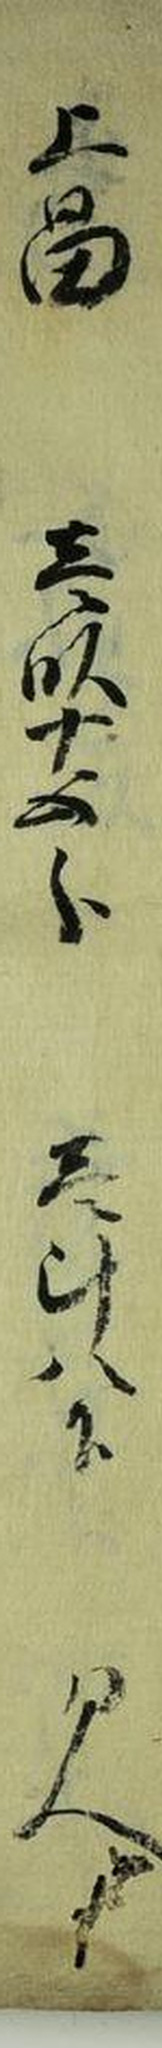上畠壱畝十五歩壱斗八升同人
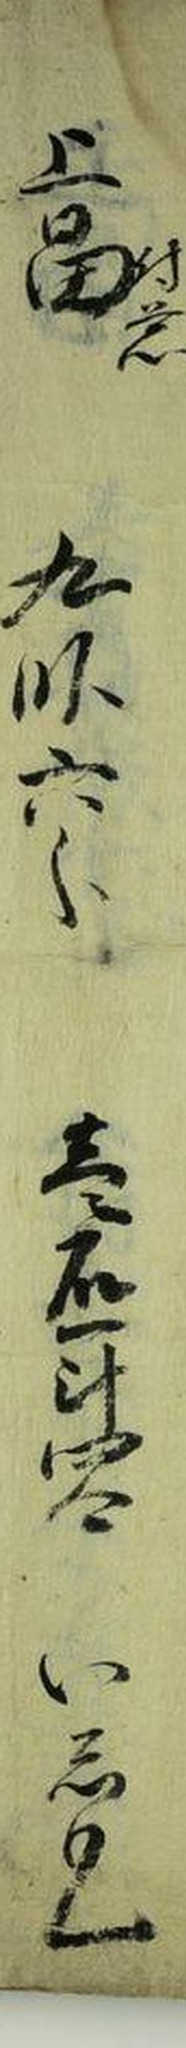上畠九畝六歩壱石一斗四合い
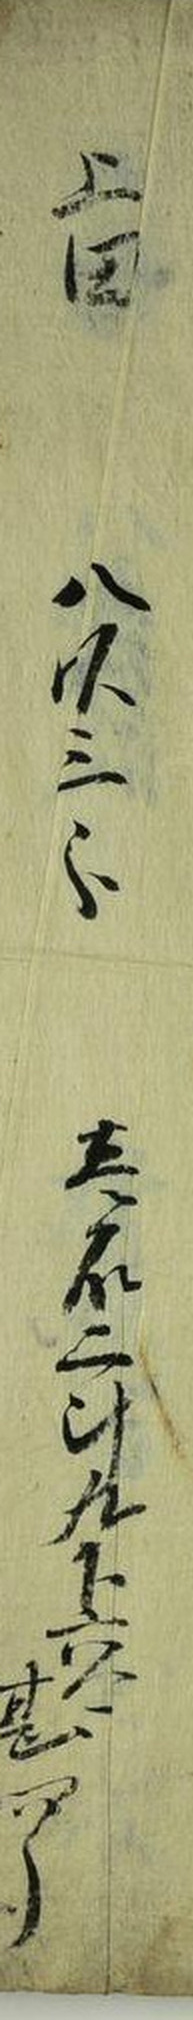上田八畝三歩壱石二斗九升六合甚四郎
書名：越前国中墨郡安沢村水帳（太閤検地帳）
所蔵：福井県文書館 Fukui Prefectural Archives
